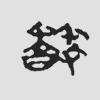築
